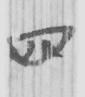四
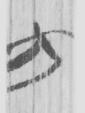方
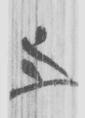之
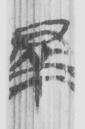羣
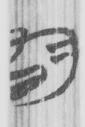旬
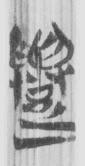{與呂止}
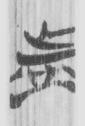者
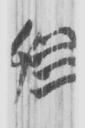於
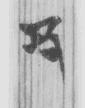邑
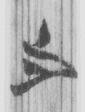之
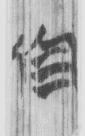於
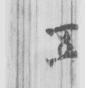五
